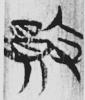敗
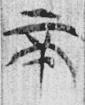不
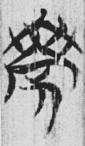○（勝）
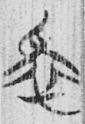○（卒）
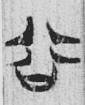谷（欲）
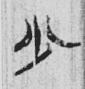少
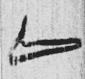㠯（以）
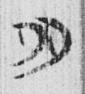多
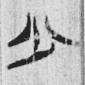少
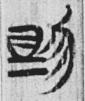則
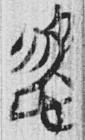惕（易）
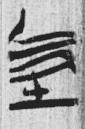圪
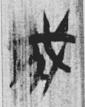成
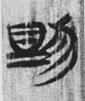則
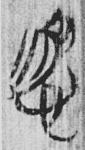惕（易）
